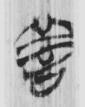善
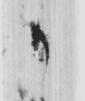人
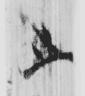之
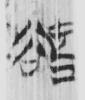欲
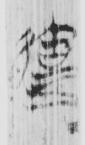達
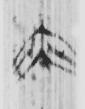亦
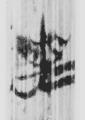若
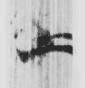上
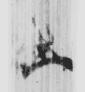之
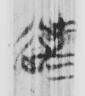欲
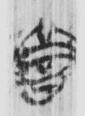善
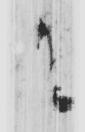人
